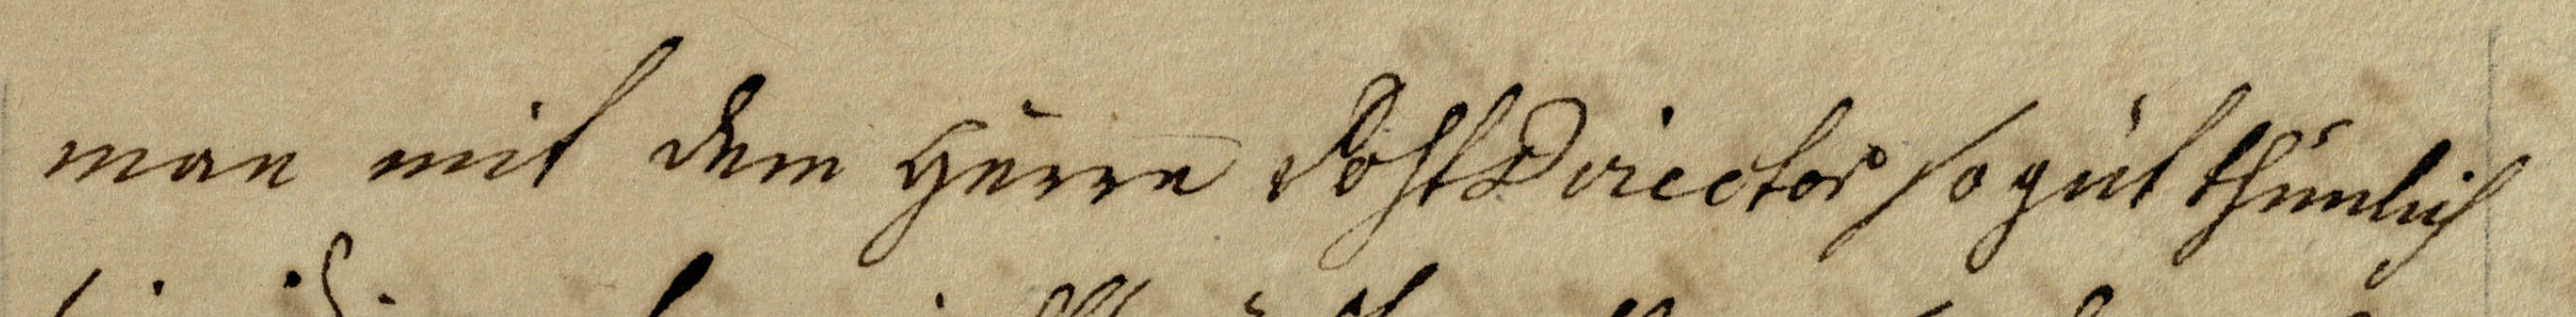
man mit dem Herrn PostDirector so gut thunlich
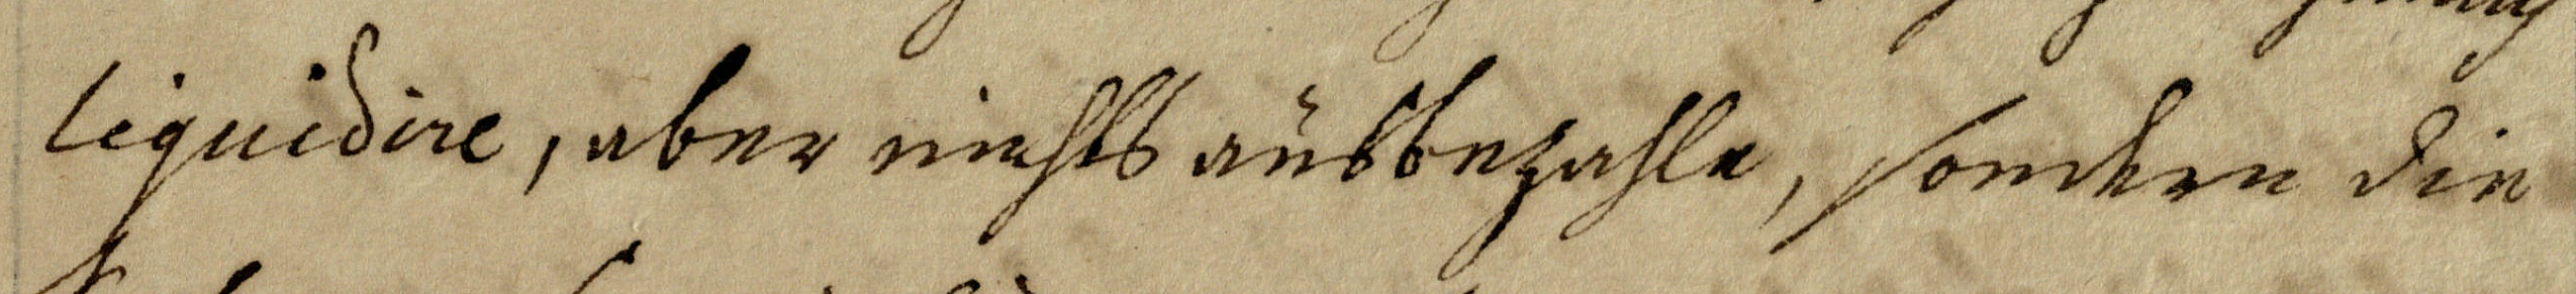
liquidire, aber nichts ausbezahle, sondern die
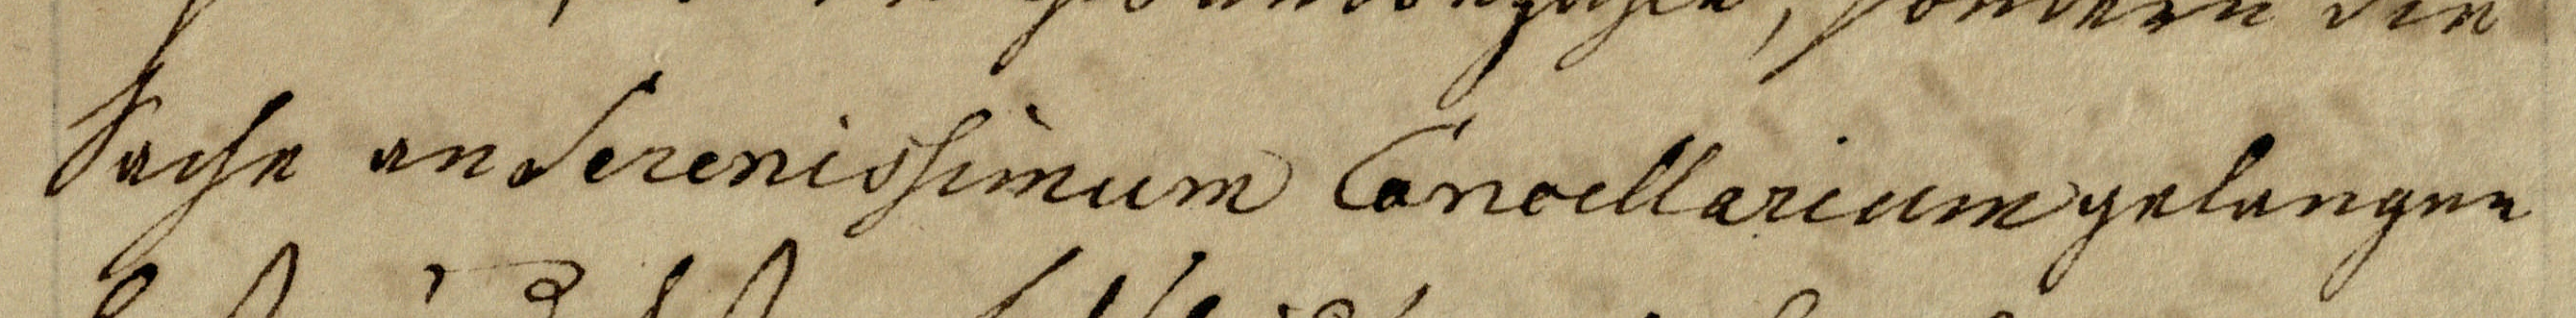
Sache an Serenissimum Cancellarium gelangen
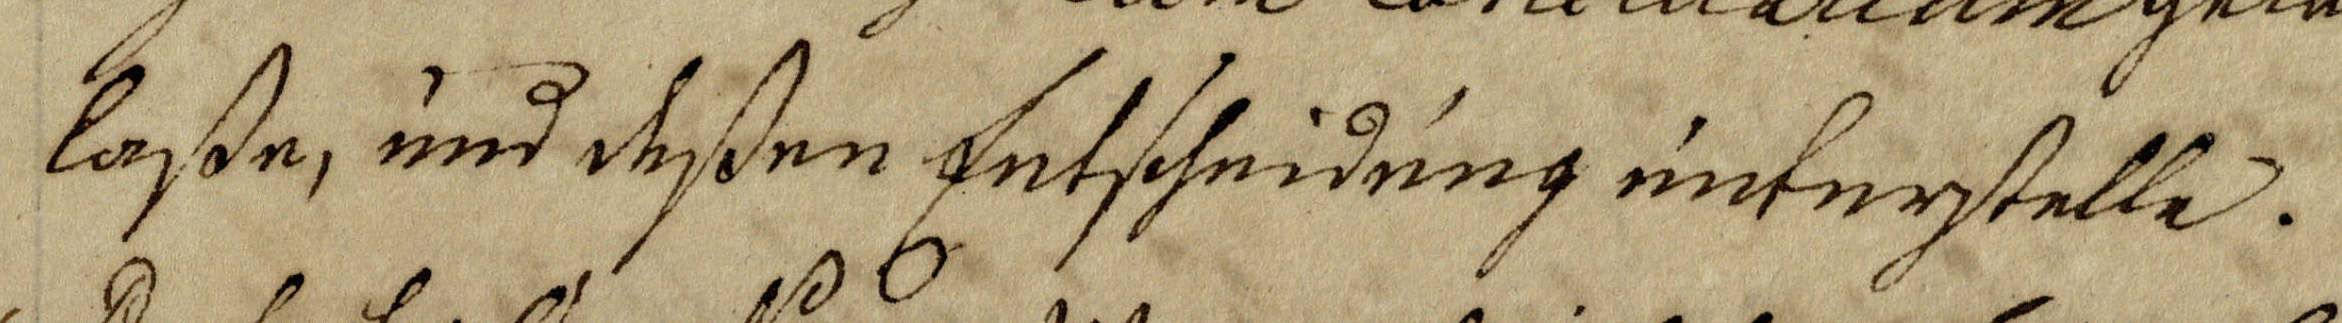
laße, und deßen Entscheidung unterstelle.
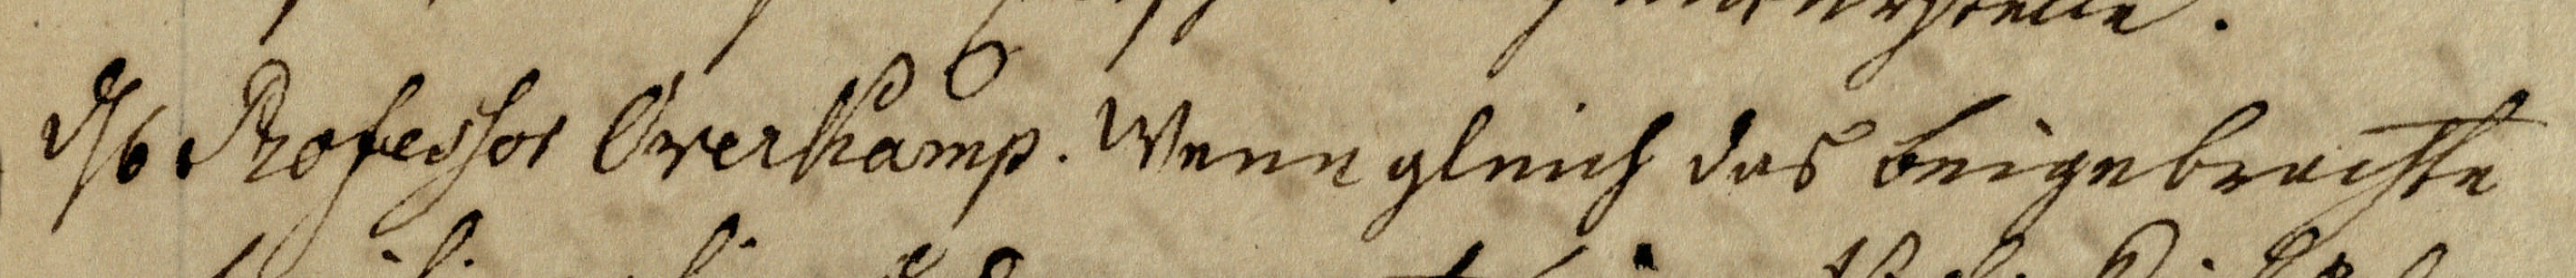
dh Professor Overkamp. Wenn gleich das beigebrachte
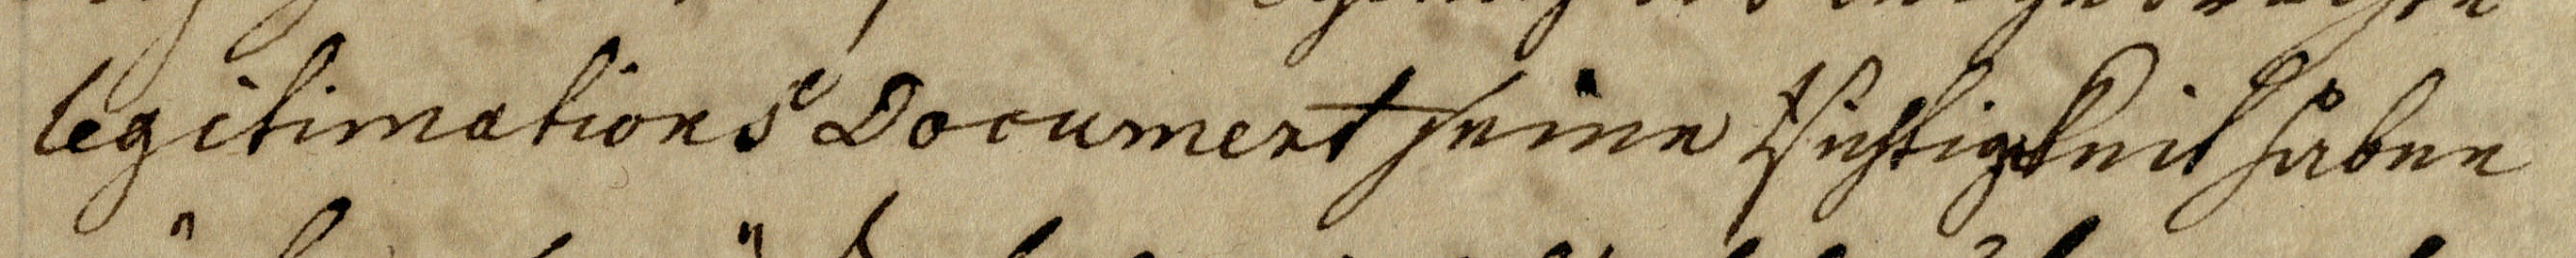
legitimations Document seine Richtigkeit haben
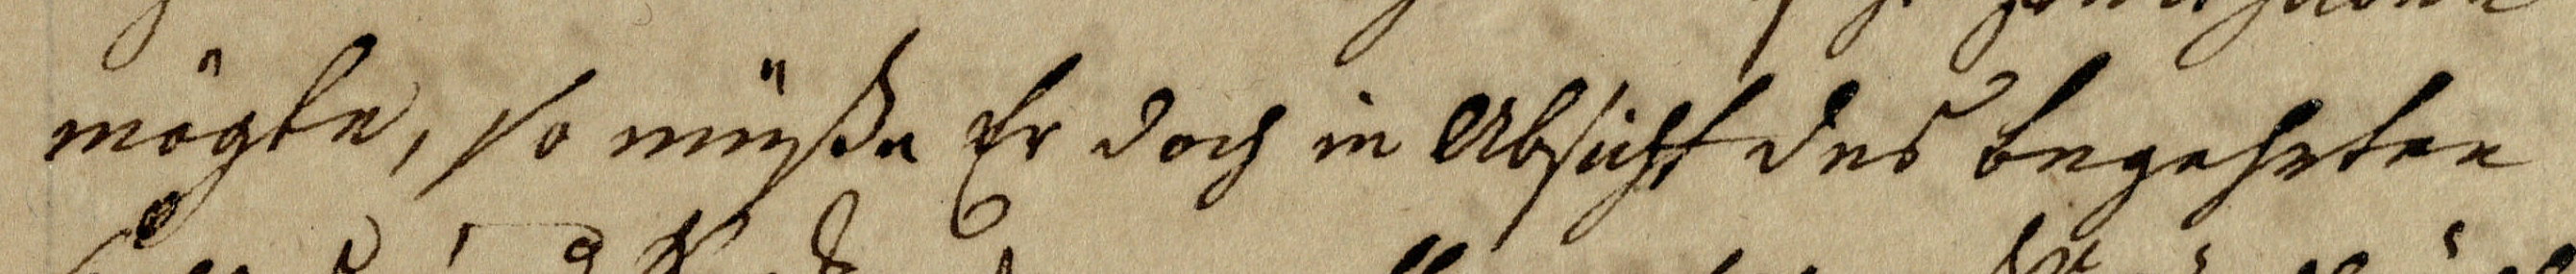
mögte, so müße Er doch in Absicht des begehrten
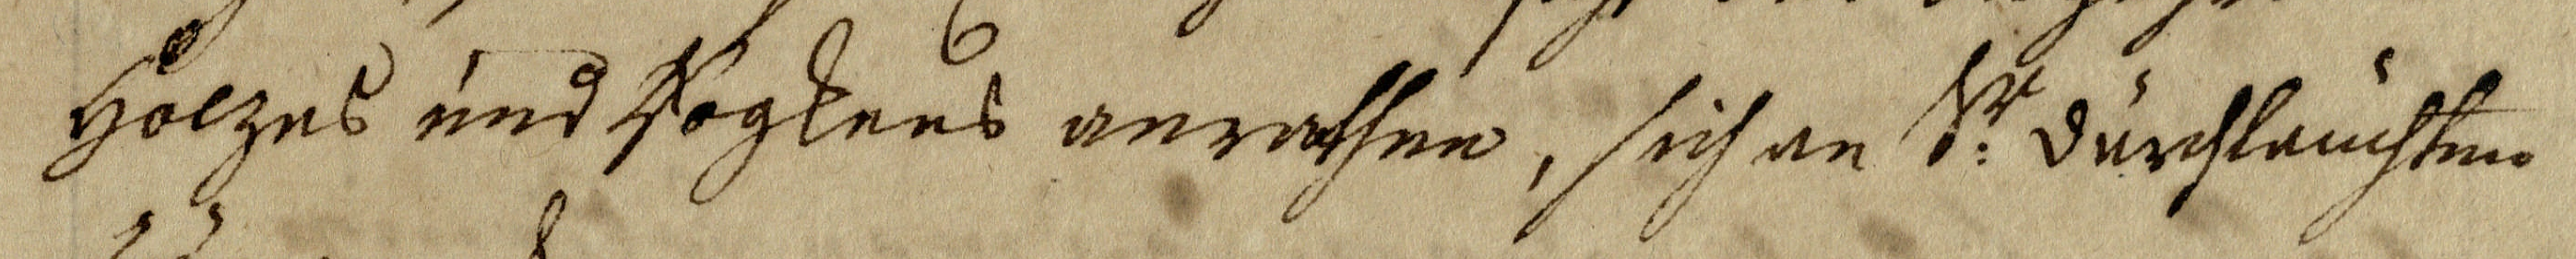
Holzes und Rogkens anrathen, sich an Sr. Durchlauchten
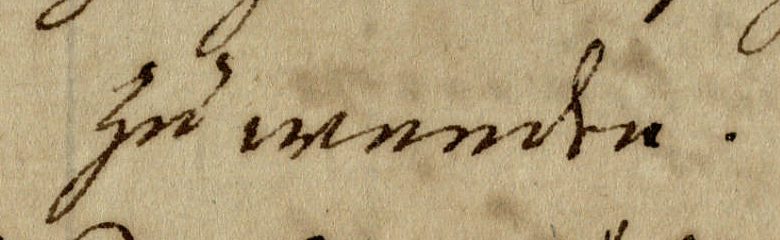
zu wenden.
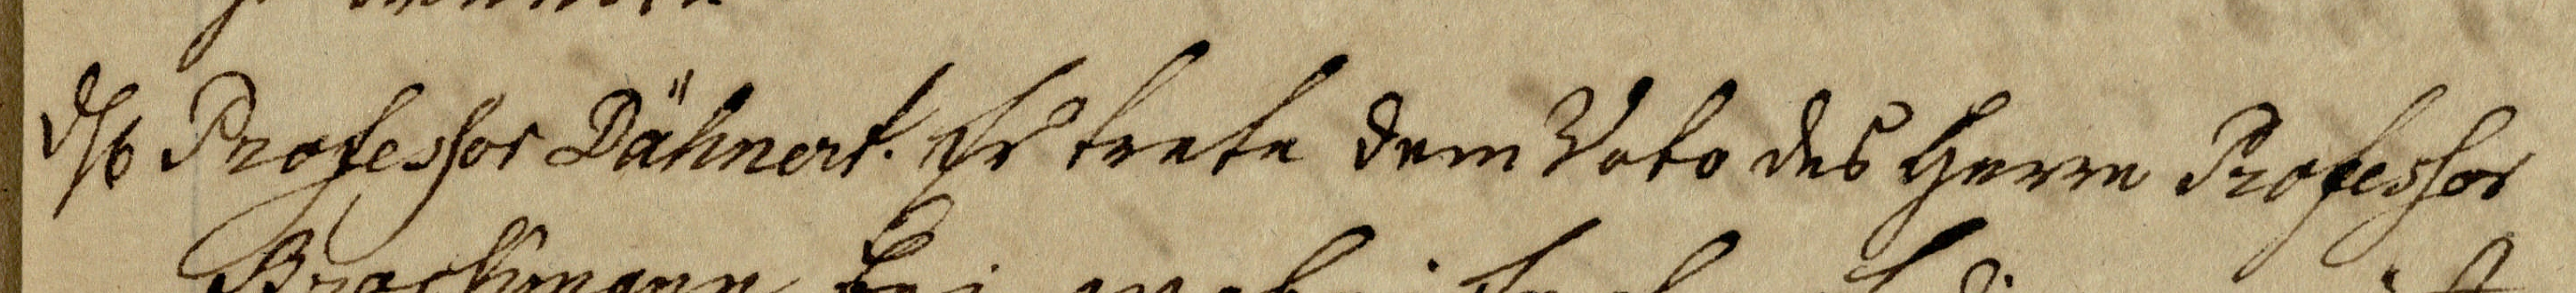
dh Professor Dähnert. Er trete dem Voto des Herrn Professor
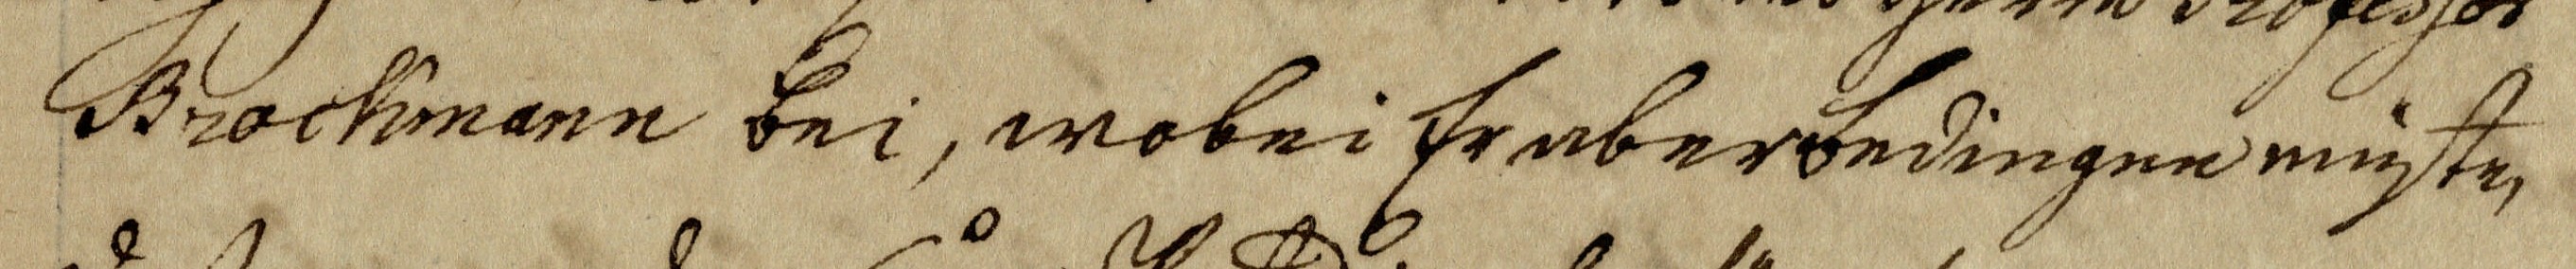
Brockmann bei, wobei Er aber bedingen müste,
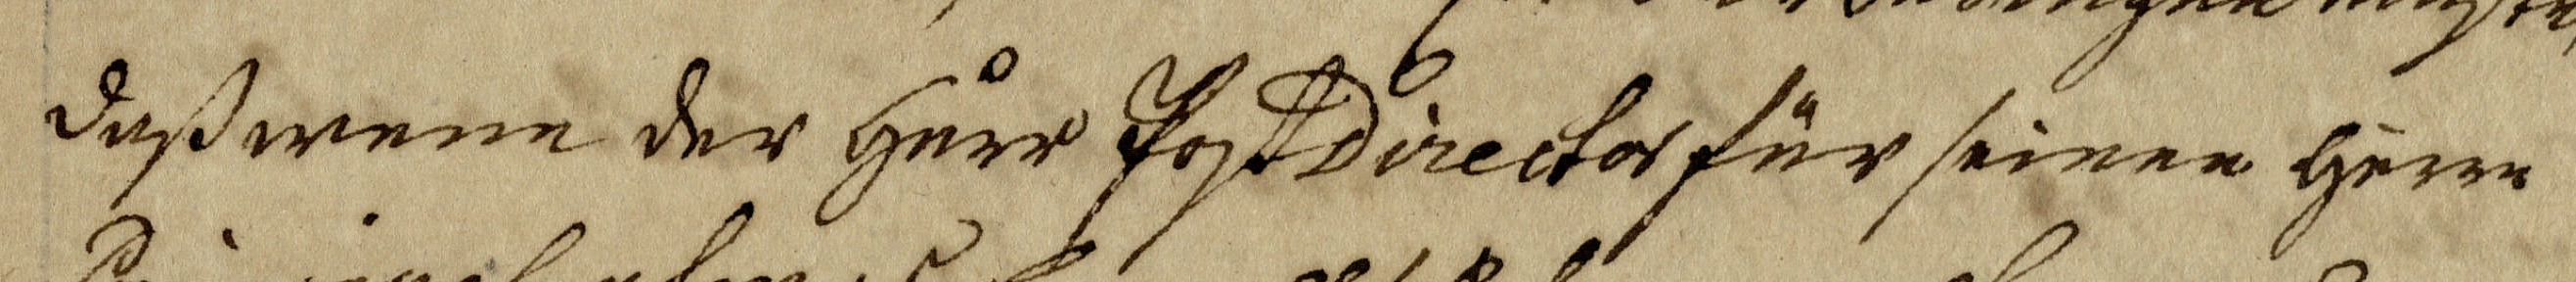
daß wenn der Herr Postdirector für seinen Herrn
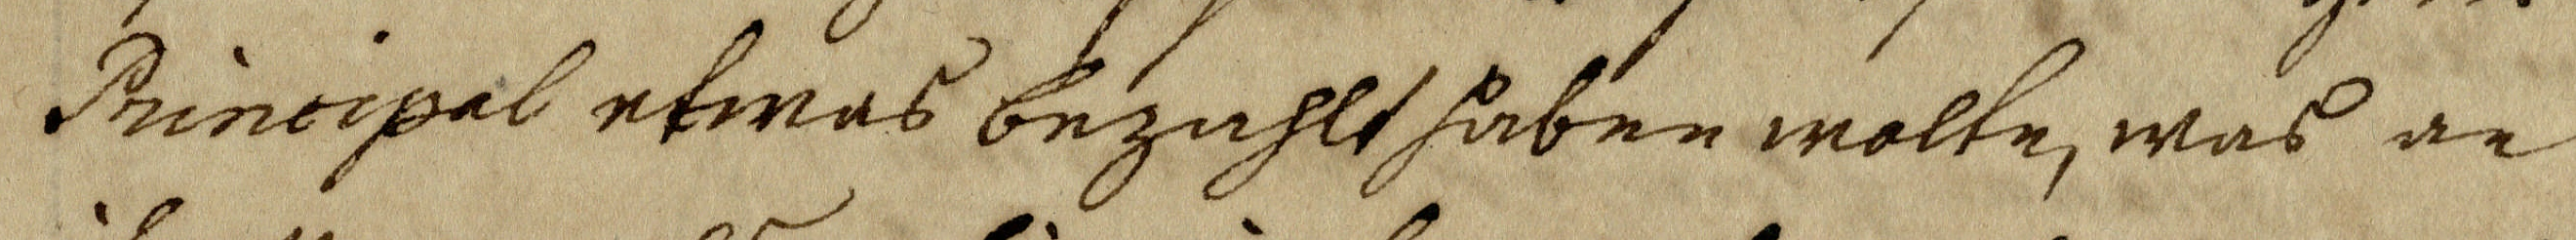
Principal etwas bezahlt haben wolte, was an
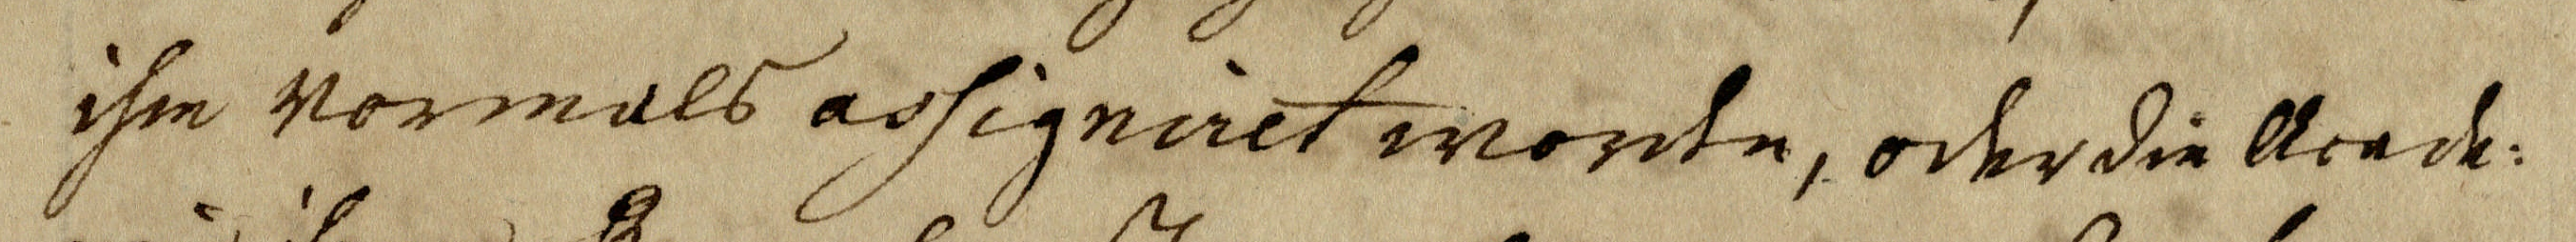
ihm vormals assigniret worden, oder die Acade¬
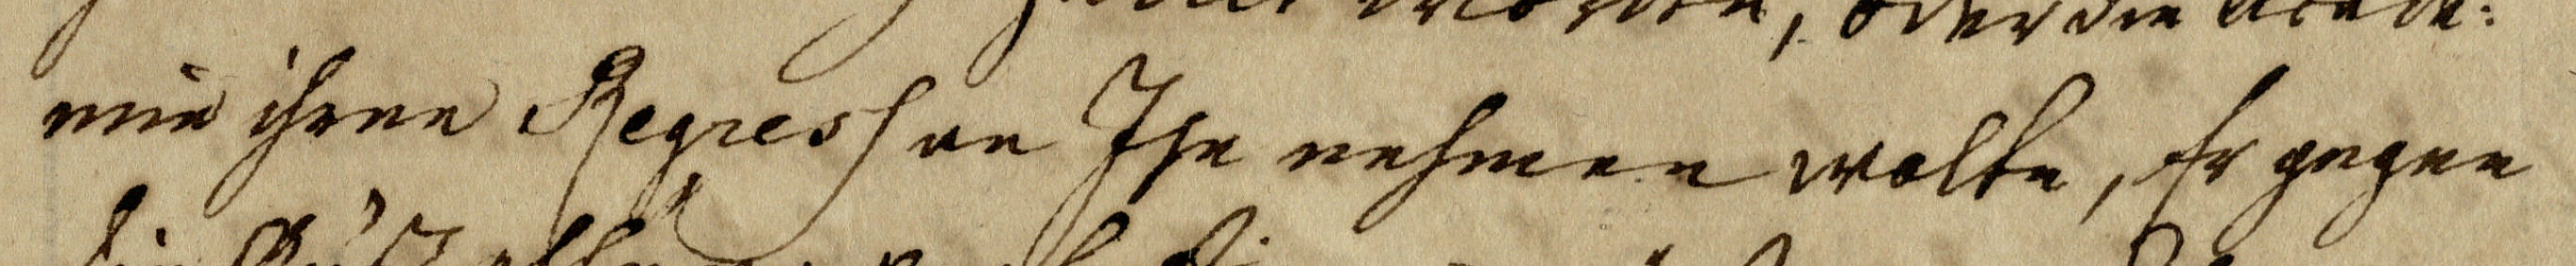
mie ihren Regress an Ihn nehmen wolte, Er gegen
